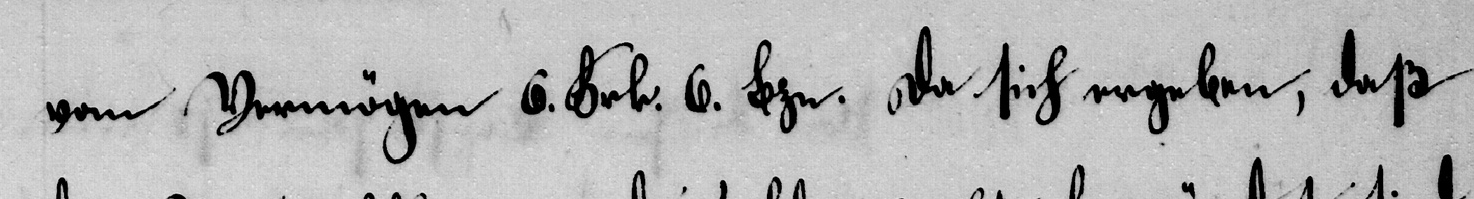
vom Vermögen 6. Frk. 6. Bzn. Da sich ergeben, daß
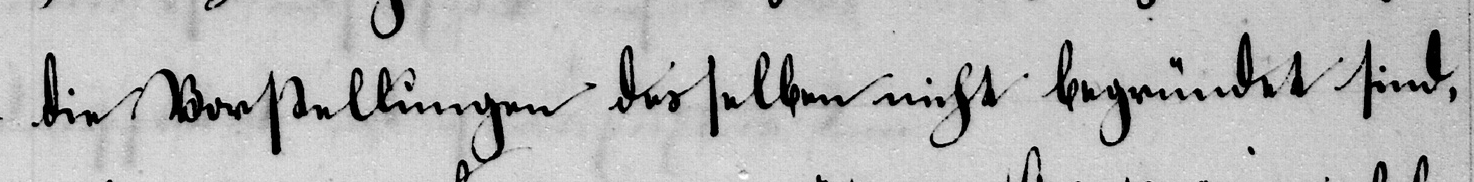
die Vorstellungen desselben nicht begründet sind,
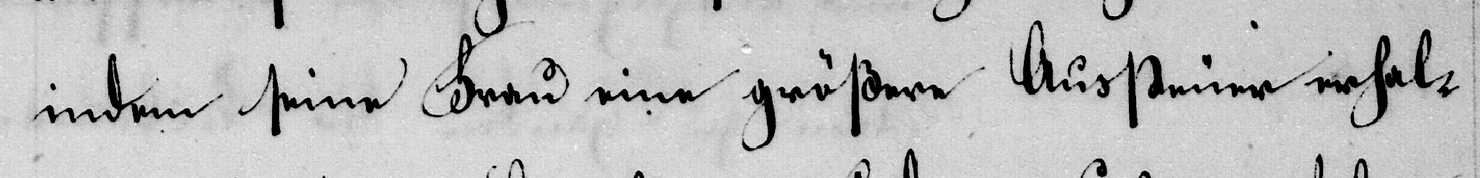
indem seine Frau eine größere Aussteuer erhal¬
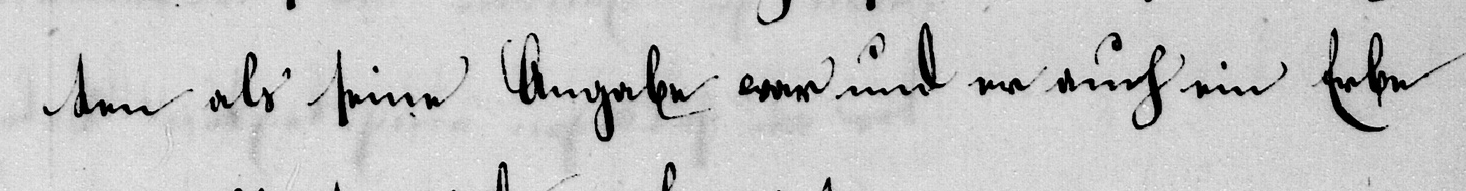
ten als seine Angabe war und er auch ein Erbe
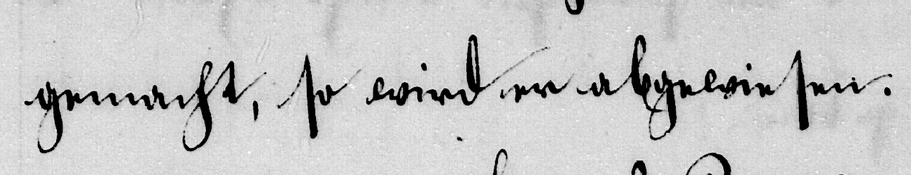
gemacht, so wird er abgewiesen.
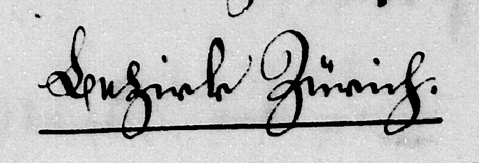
Bezirk Zürich.
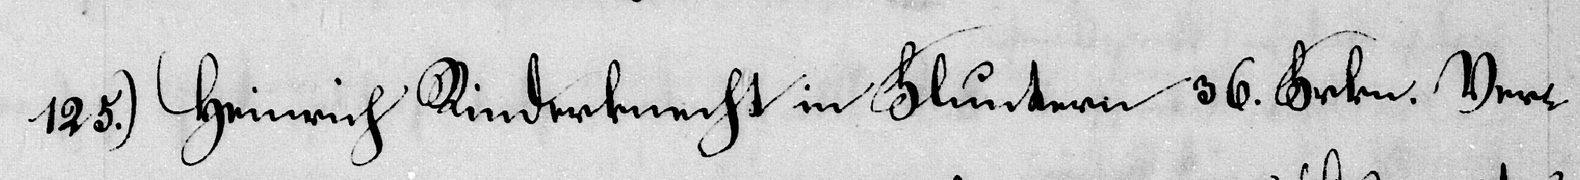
125.) Heinrich Rinderknecht in Fluntern 36. Frkn. Ver¬
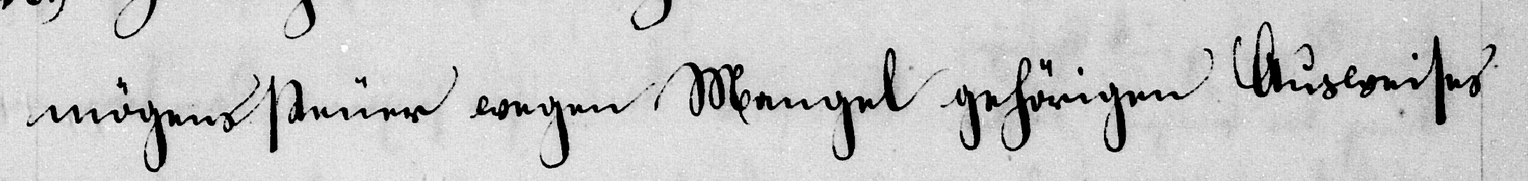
mögenssteuer wegen Mangel gehörigen Ausweises
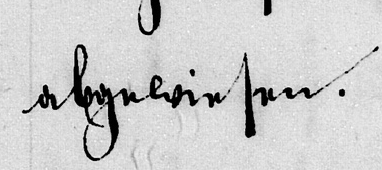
abgewiesen.
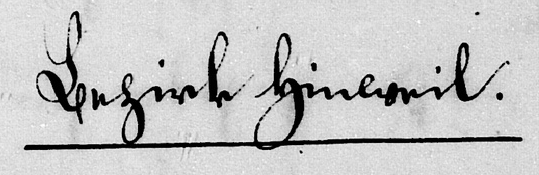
Bezirk Hinweil.
